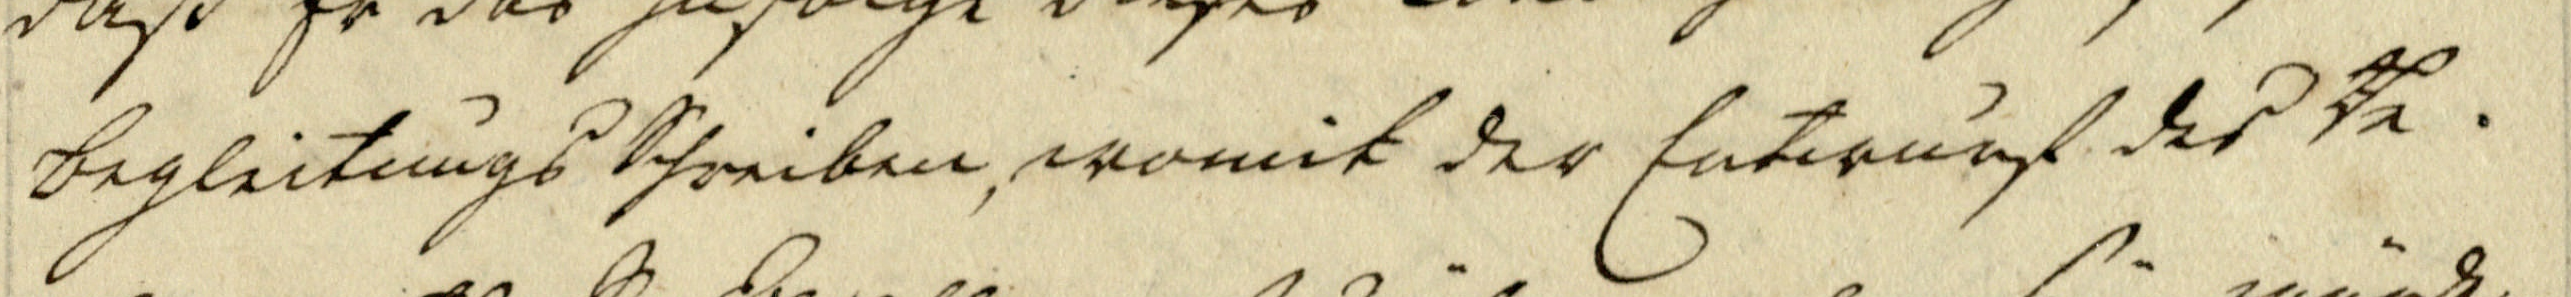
Begleitungs Schreiben, womit der Entwurf des Re¬
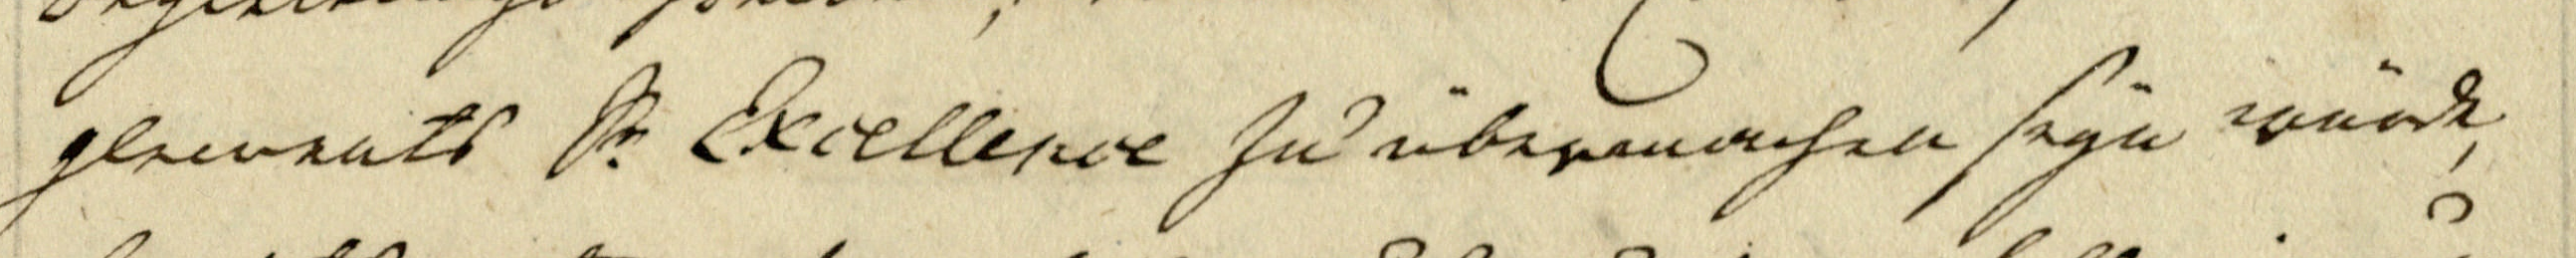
glements Sr Excellence zu überwachen seÿn würde,
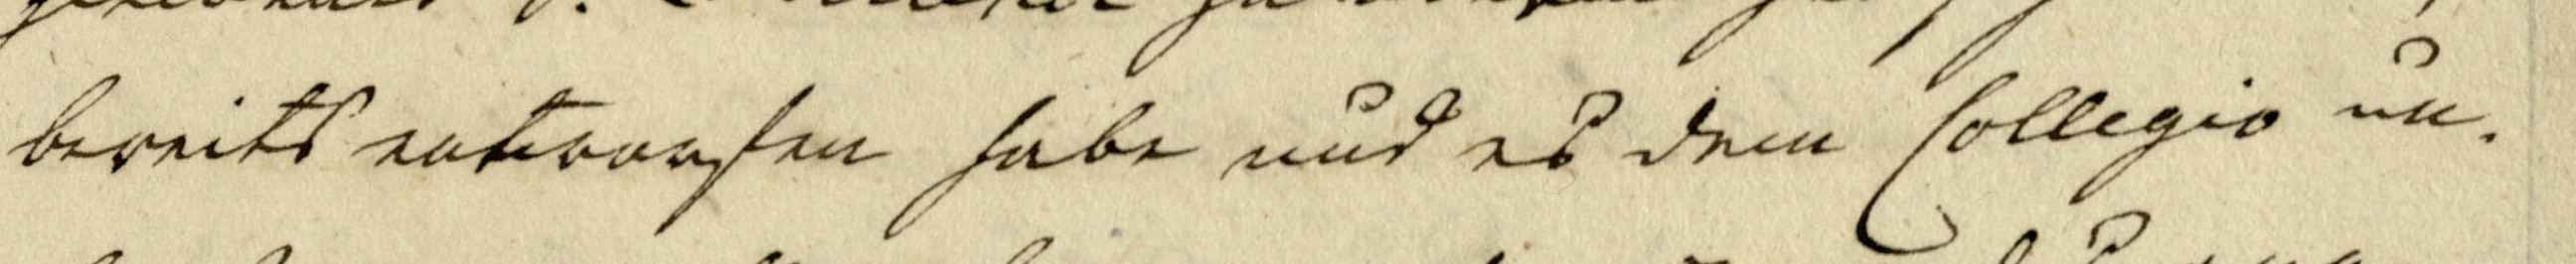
bereits entworfen habe und es dem Collegio un¬
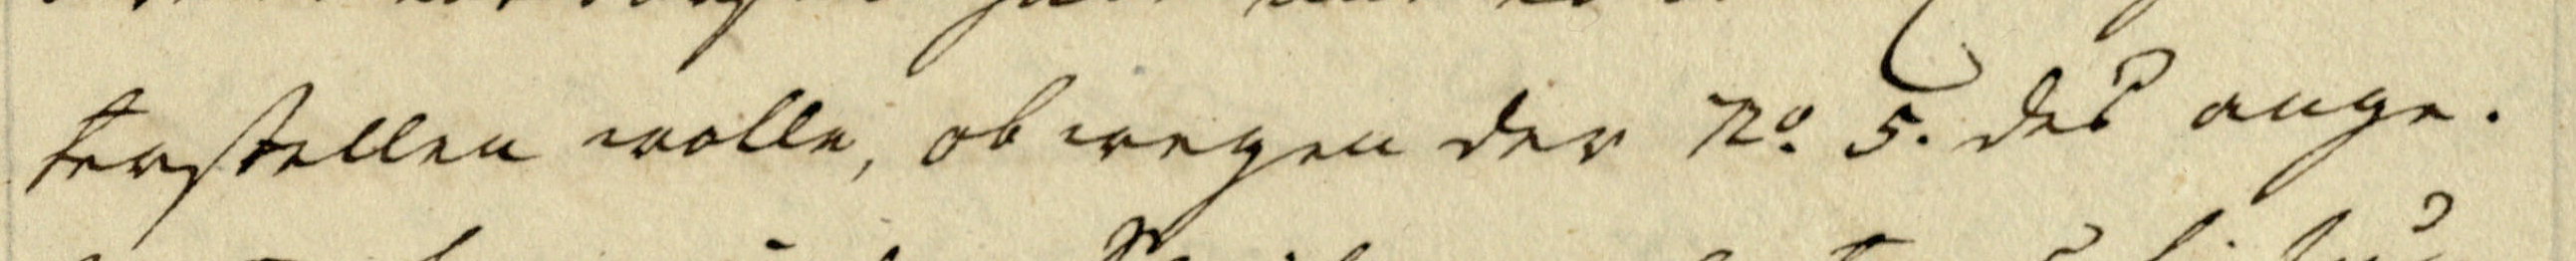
terstellen wolle, ob wegen der No. 5. des ange¬
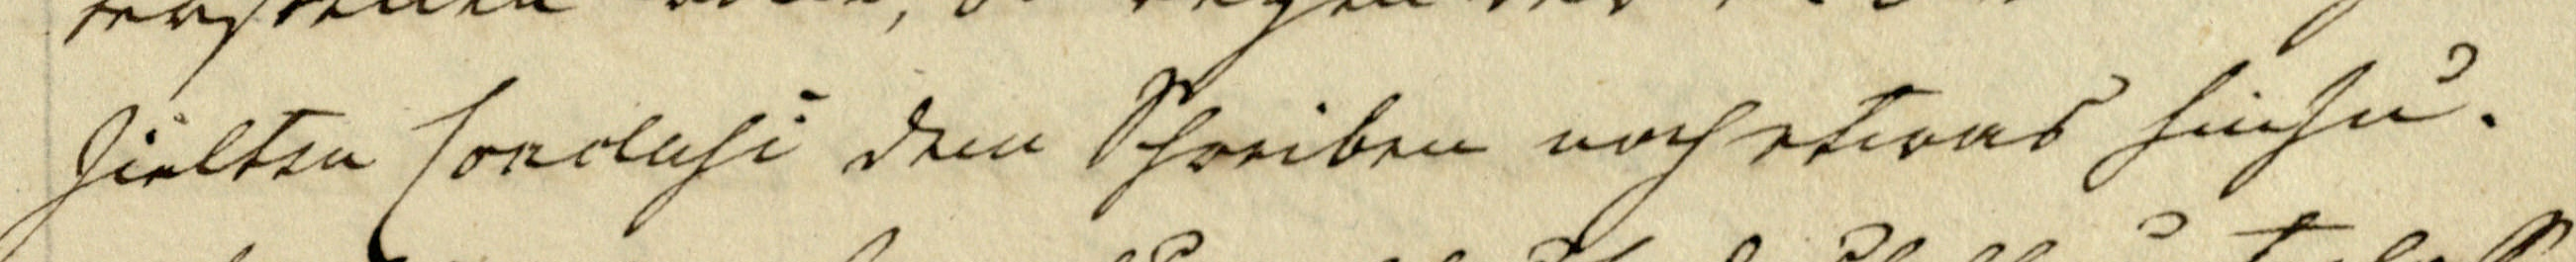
zielten Conclusi dem Schreiben noch etwas hinzu¬
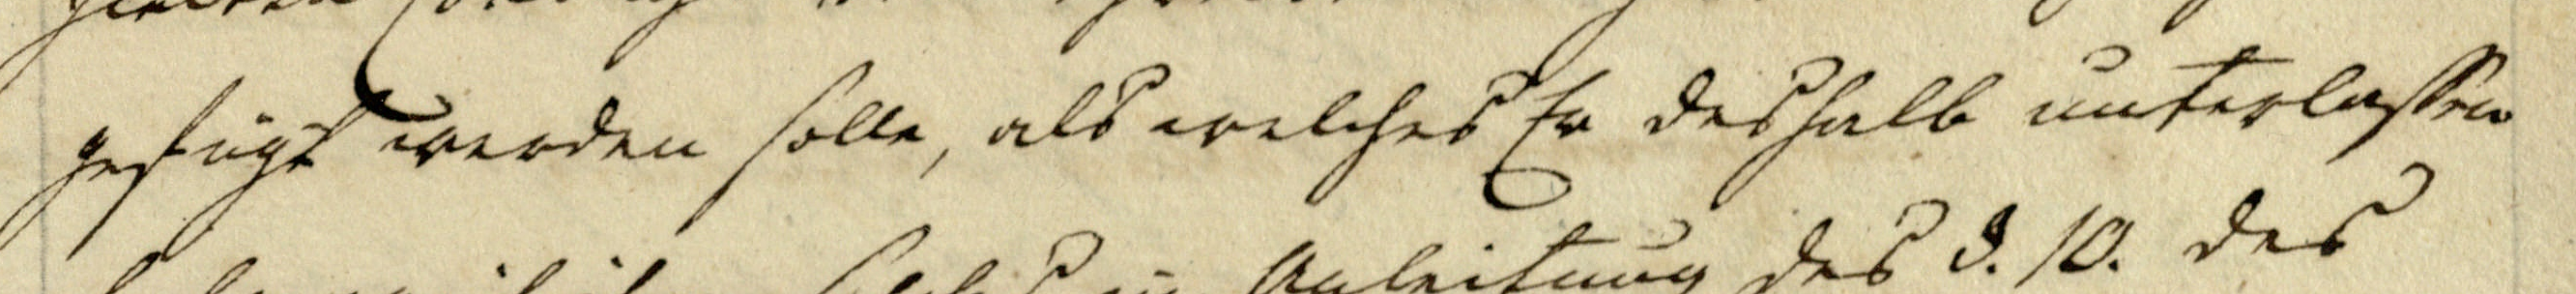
gefügt werden solle, als welches Er deshalb unterlassen
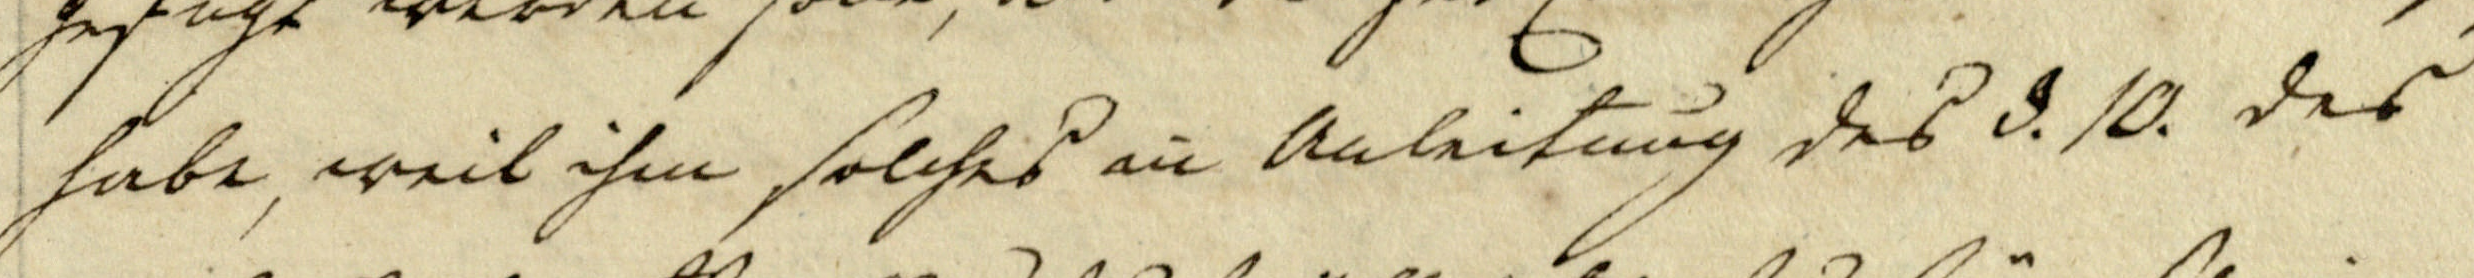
habe, weil ihm solches in Anleitung des §. 10. des
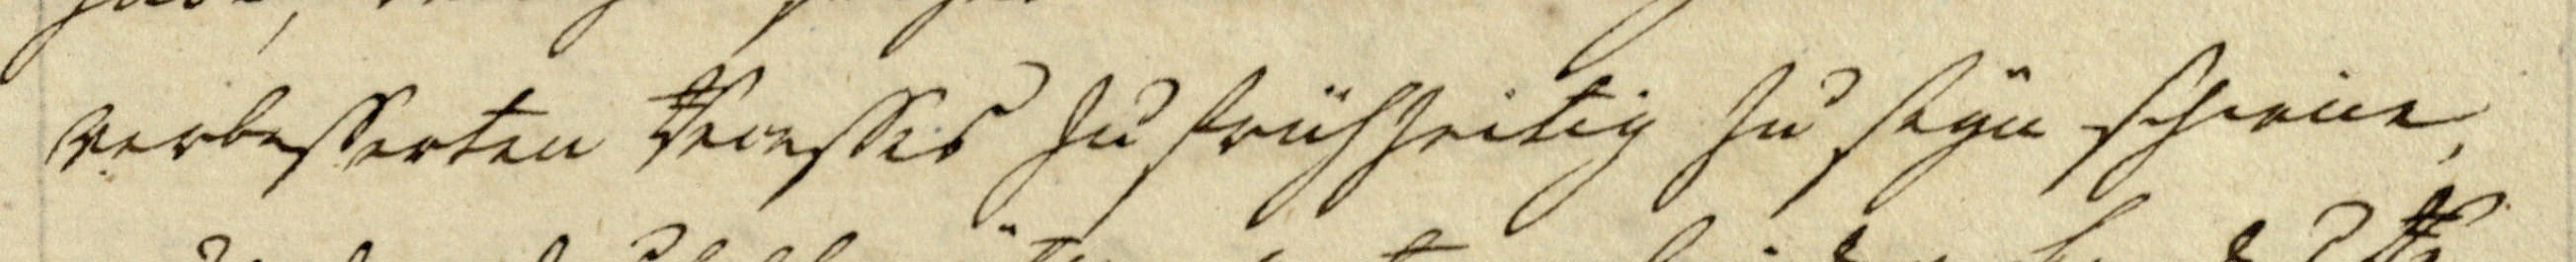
verbesserten Recesses zu frühzeitig zu seÿn schiene,
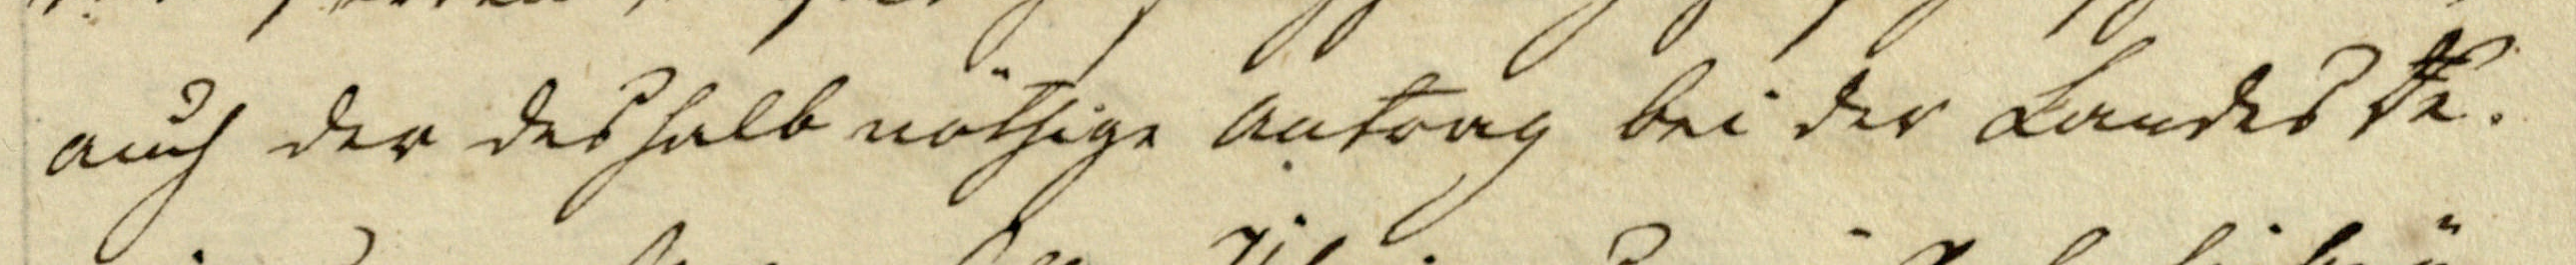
auch der deshalb nöthige Antrag bei der Landes Re¬
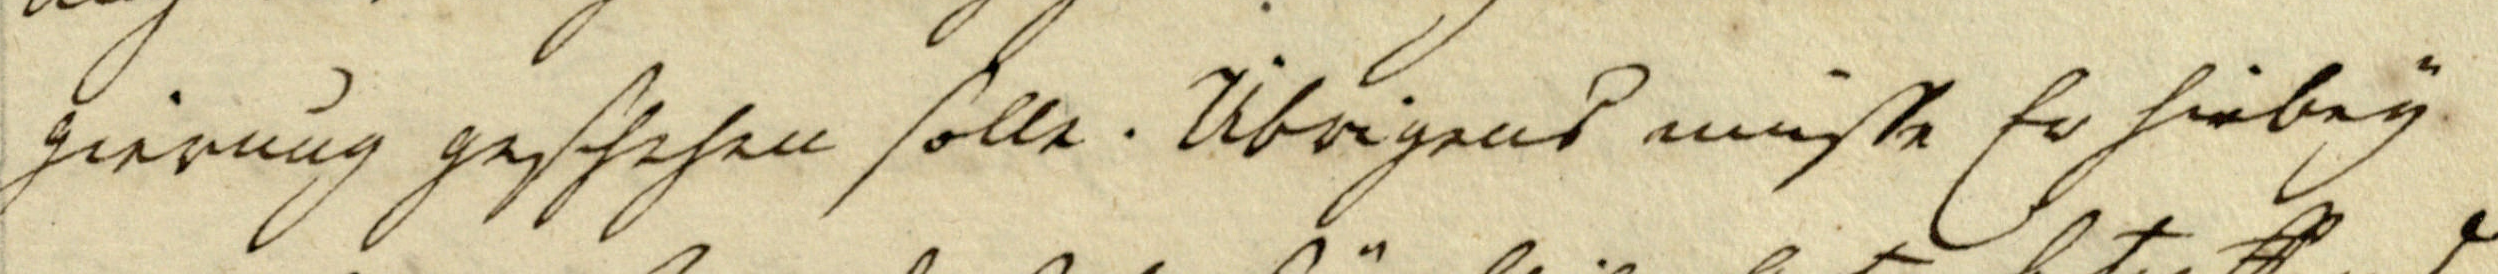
gierung geschehen solle. Übrigens müsse Er hiebeÿ
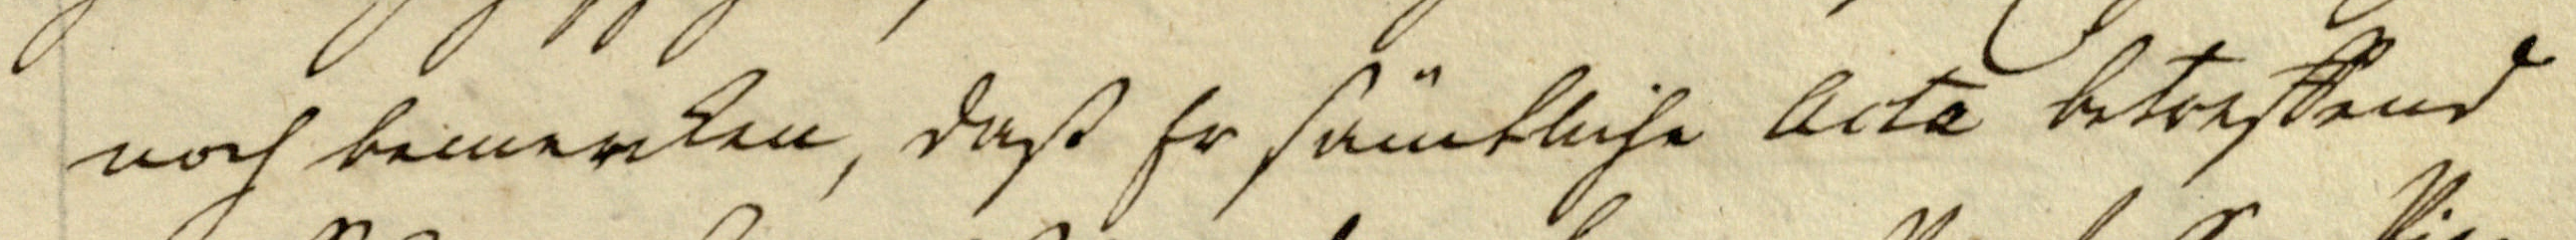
noch bemercken, daß Er sämtliche Acta betreffend
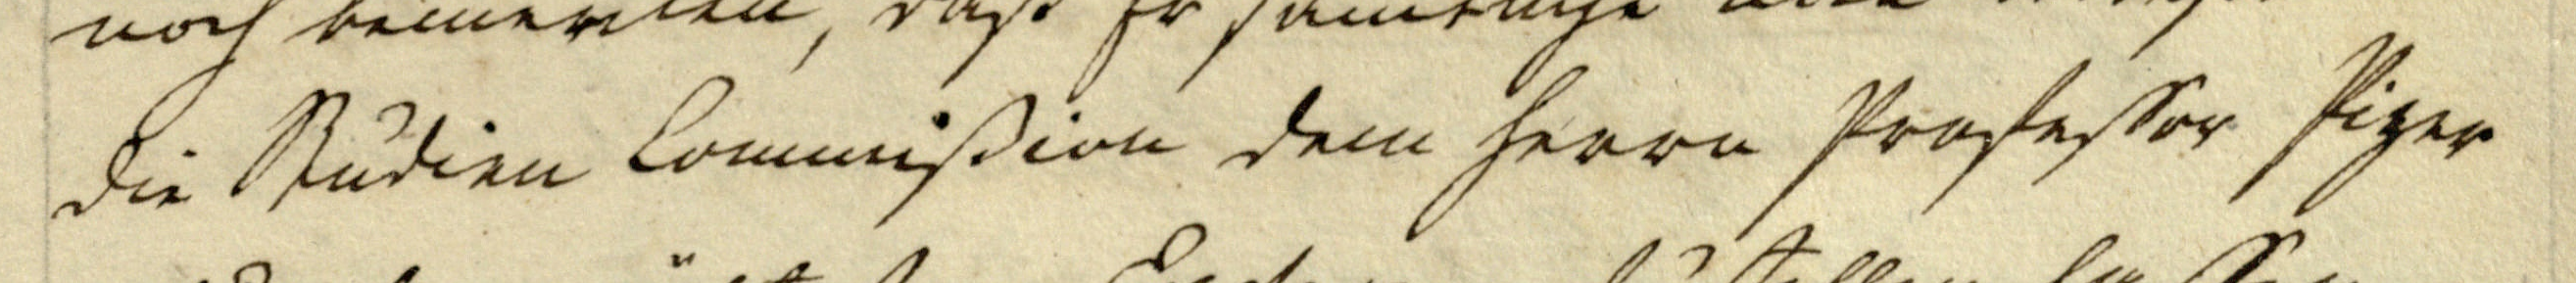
die Studien Commission dem Herrn Professor Piper
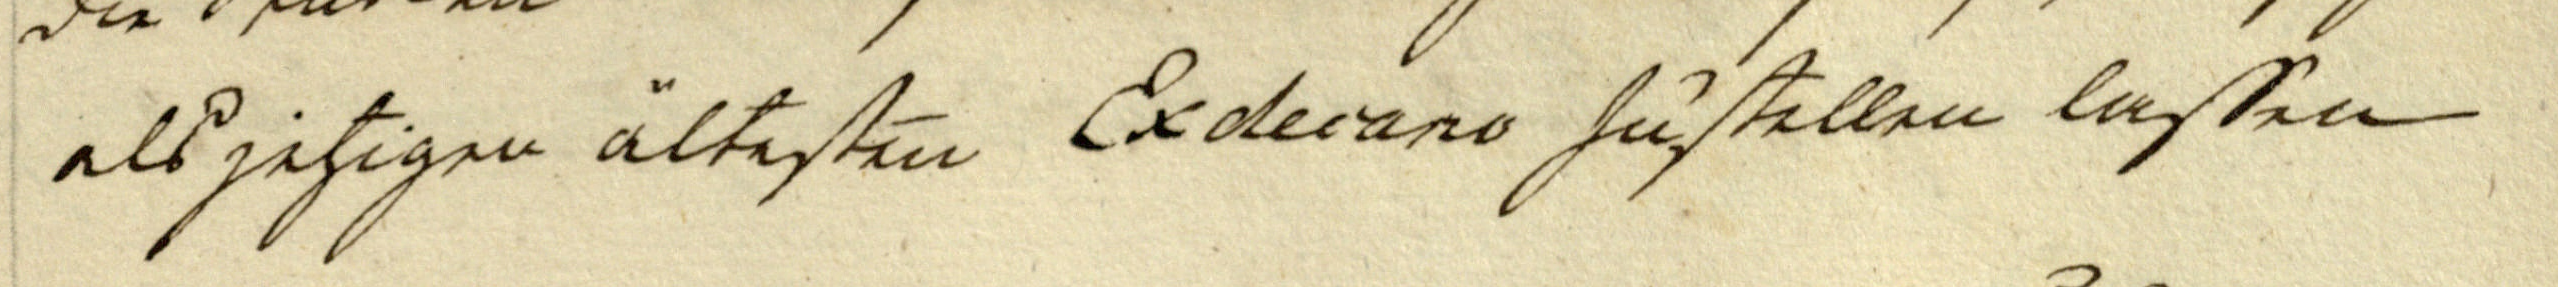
als jetzigen ältesten Exdecano zustellen lassen
